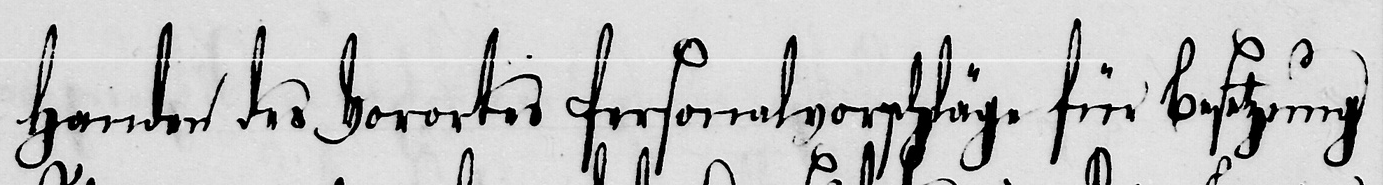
Handen des Vorortes Personalvorschläge
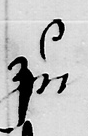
für
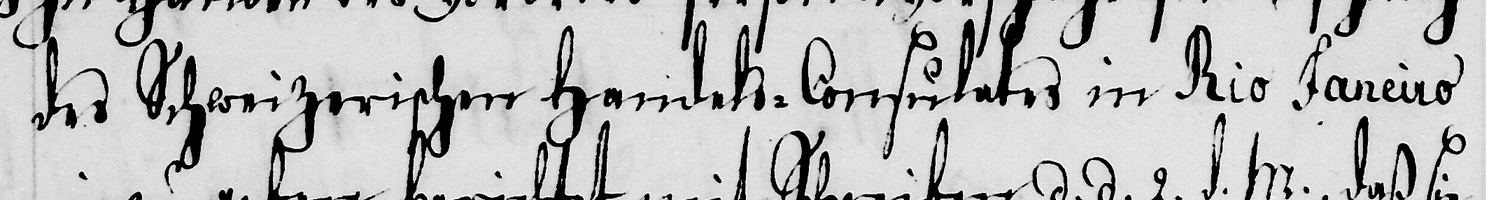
des Schweizerischen Handels-Consulates in Rio Janeiro
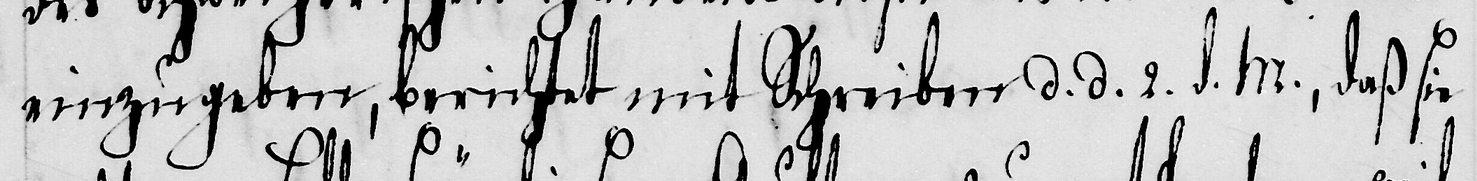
einzugeben, berichtet mit Schreiben d.d. 2. d. M., daß sie
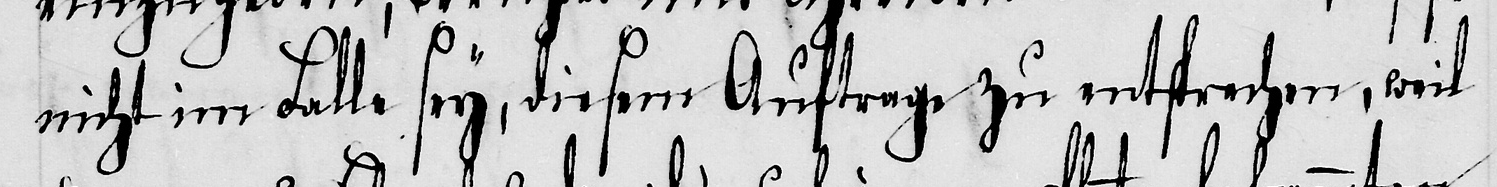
nicht im Falle sey, diesem Auftrage zu entsprechen, weil
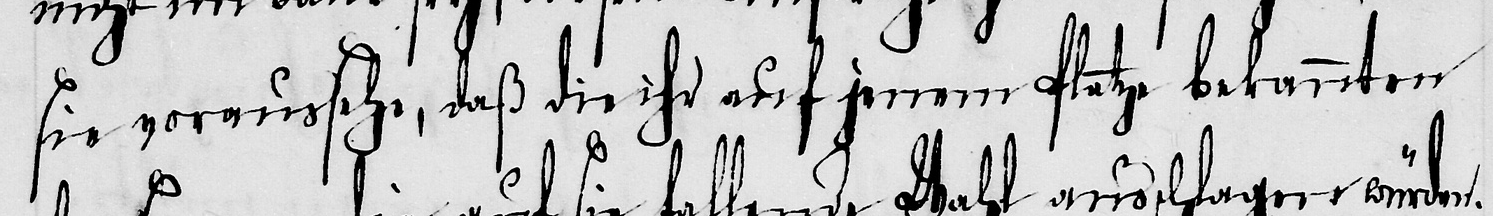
sie voraussehe, daß die ihr auf jenem Platze bekannten
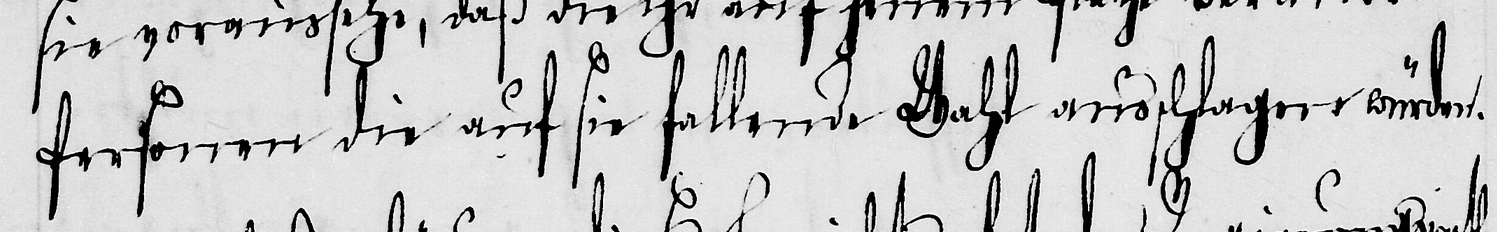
Personen die auf sie fallende Wahl ausschlagen würde¬
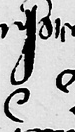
n.
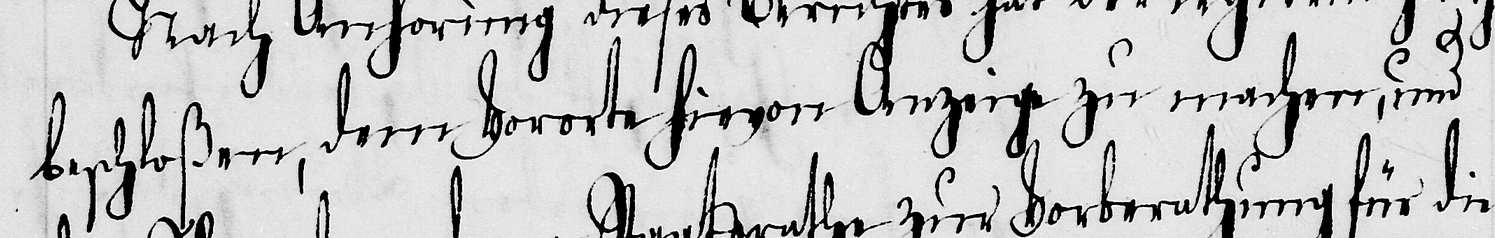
beschloßen, dem Vororte hievon Anzeige zu machen, und
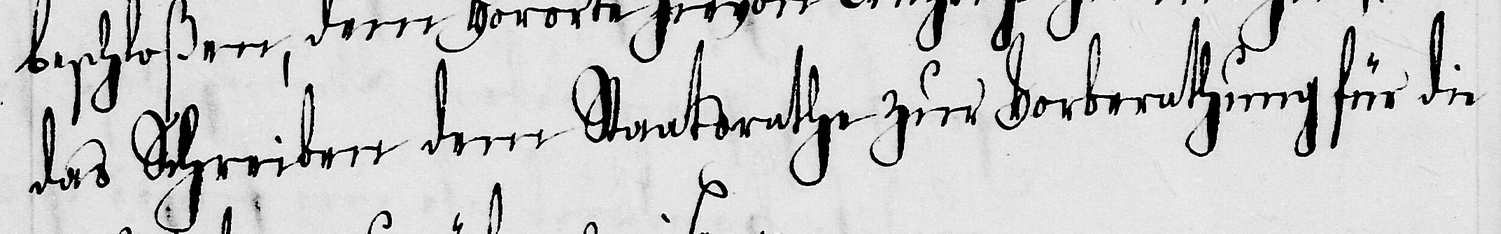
das Schreiben dem Staatsrathe zur Vorberathung für die
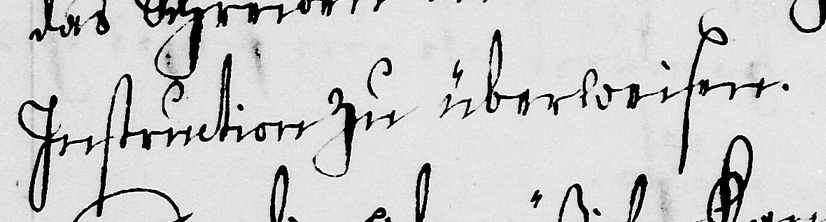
Instruction zu überweisen.
